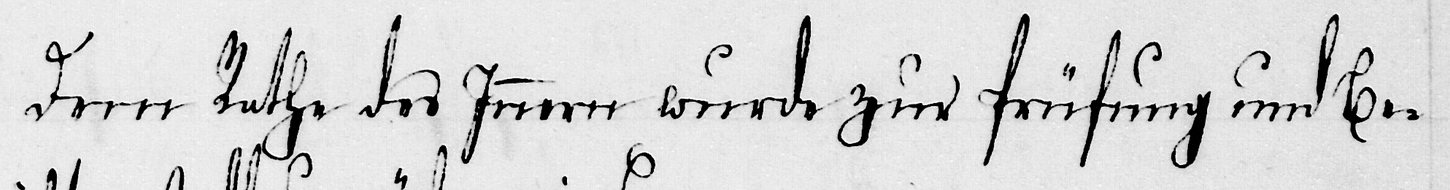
Dem Rathe des Innern wurde zur Prüfung und Be¬
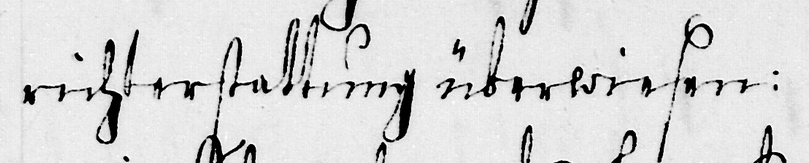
richterstattung überwiesen:
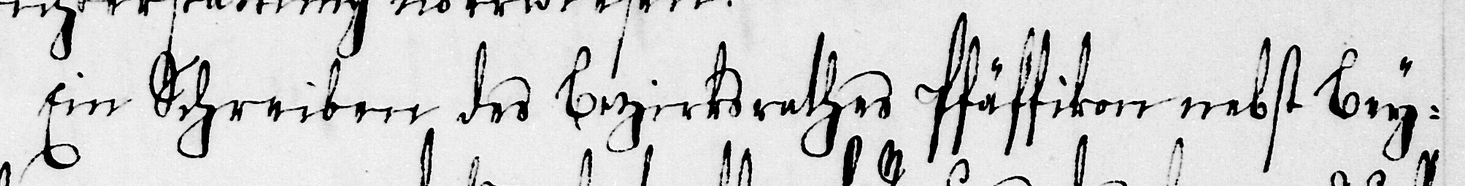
Ein Schreiben des Bezirksrathes Pfäffikon nebst Bey¬
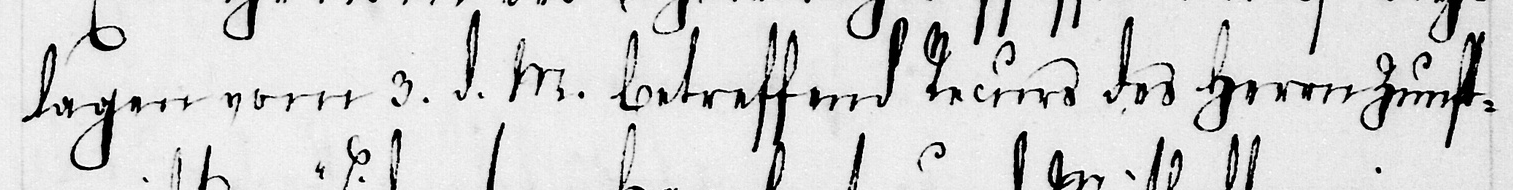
lagen vom 3. d. M. betreffend Recurs des Herrn Zunft¬
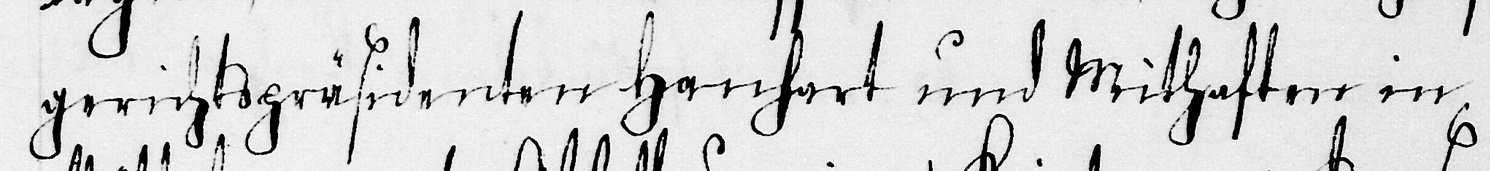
gerichtspräsidenten Hanhart und Mithaften in
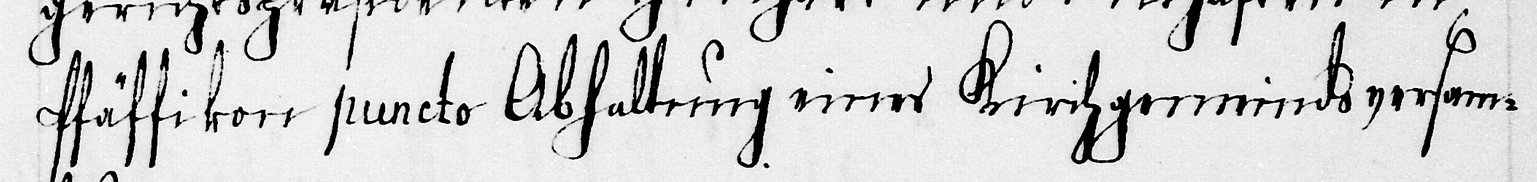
Pfäffikon puncto Abhaltung einer Kirchgemeindsversamm¬
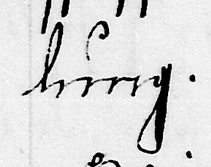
lung.
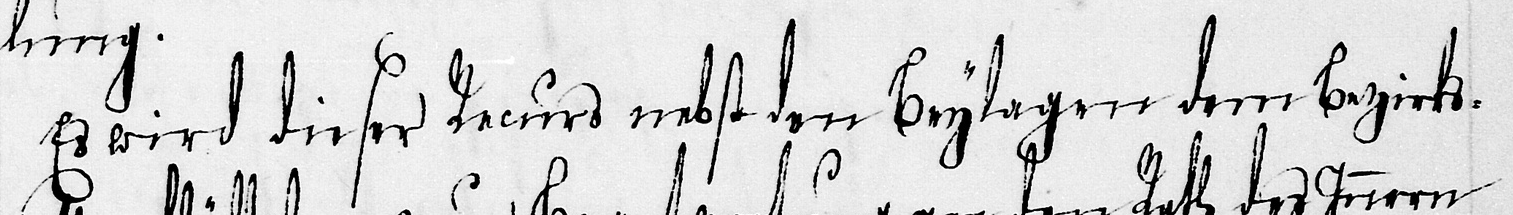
Es wird dieser Recurs nebst den Beylagen dem Bezirks¬
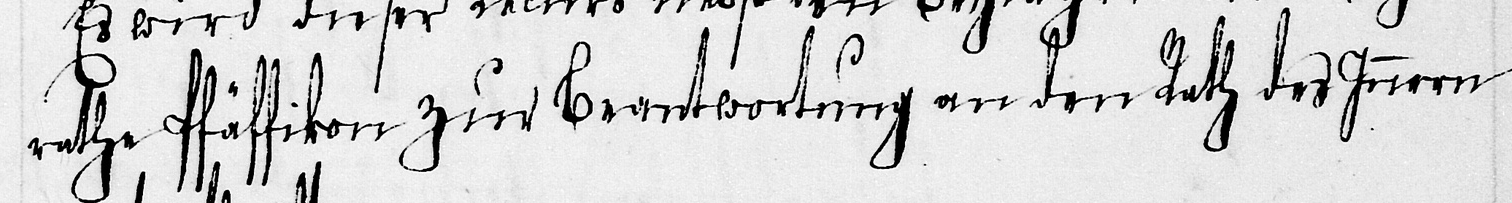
rathe Pfäffikon zur Beantwortung an den Rath des Innern
